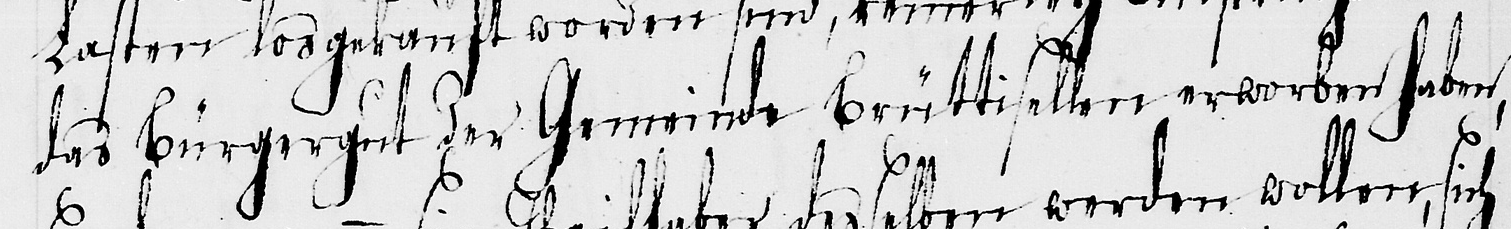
das Bürgergut der Gemeinde Brüttisellen erworben haben,
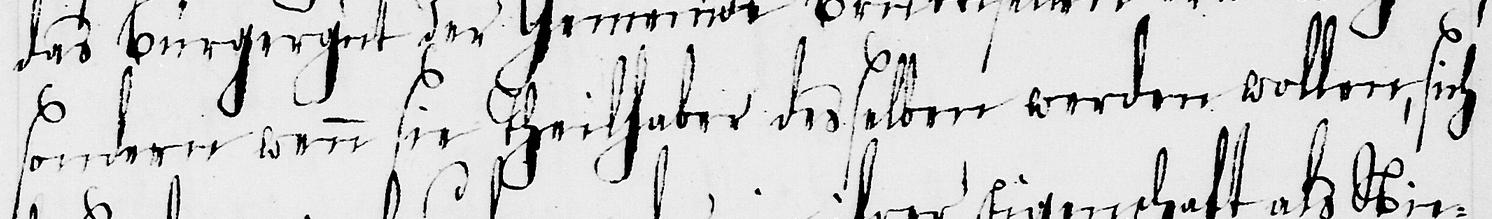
sondern wenn sie Theilhaber desselben werden wollen, sich
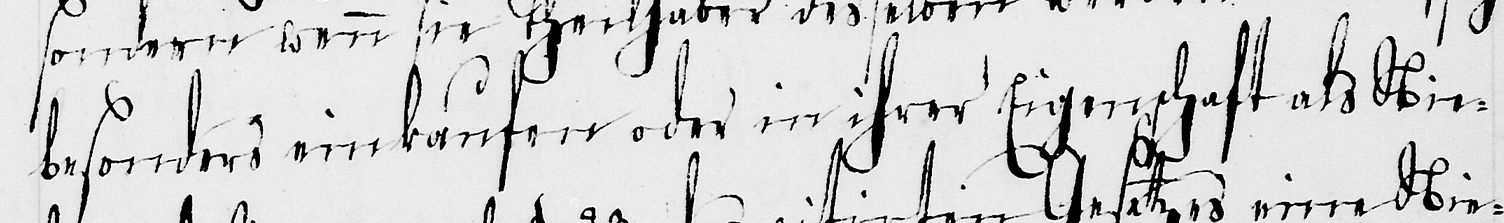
besonders einkaufen oder in ihrer Eigenschaft als Nie¬
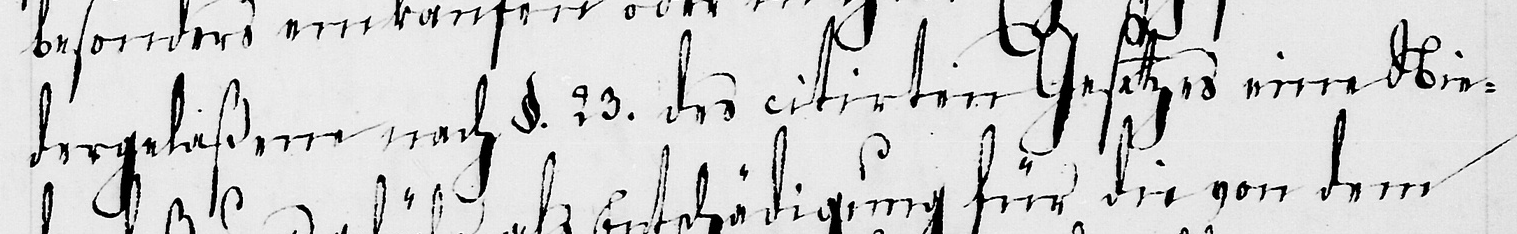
dergelaßene nach §. 23. des citirten Gesetzes eine Nie¬
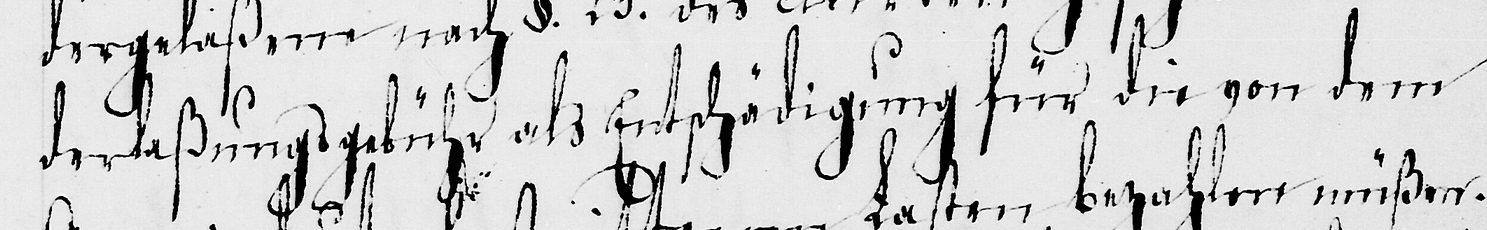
derlaßungsgebühr als Entschädigung für die von dem
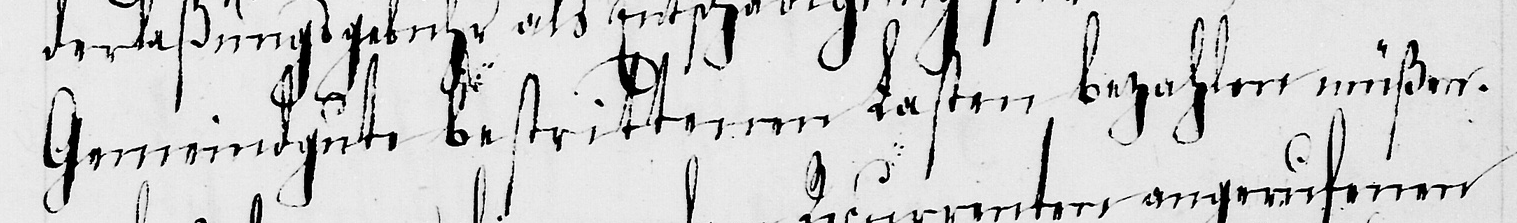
Gemeindgute bestrittenen Lasten bezahlen müßen.
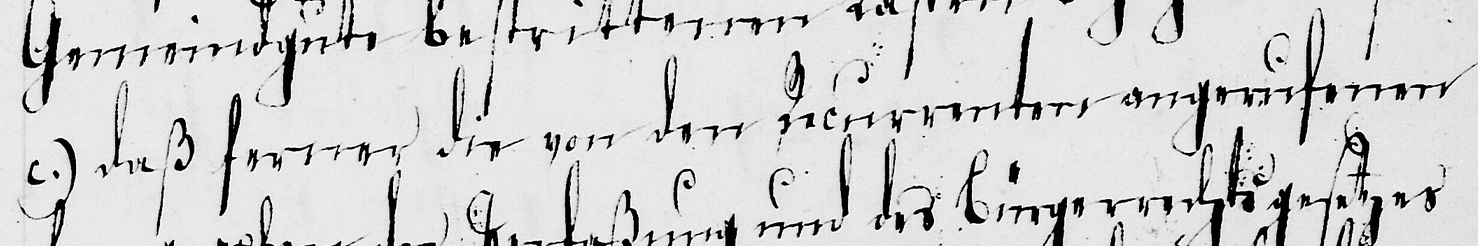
c.) Daß ferner die von den Recurrenten angerufenen
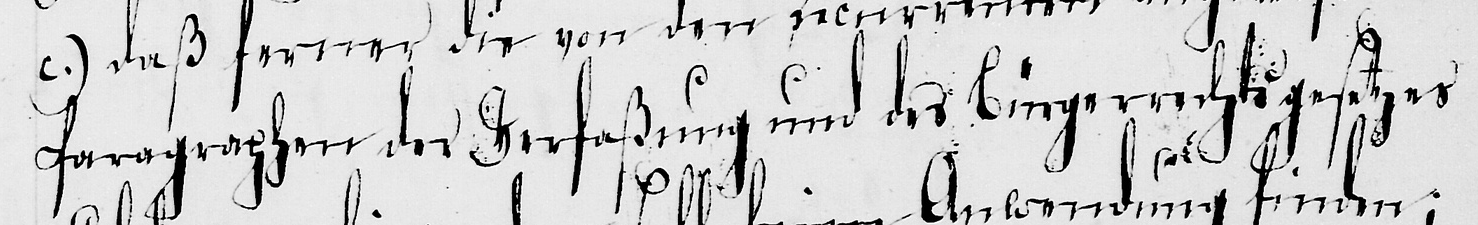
Paragraphen der Verfaßung und des Bürgerrechtsgesetzes
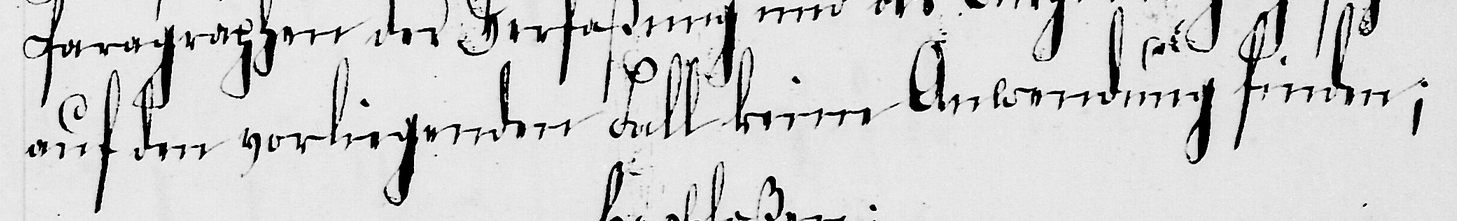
auf den vorliegenden Fall keine Anwendung finden;
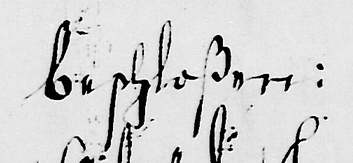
beschloßen:
